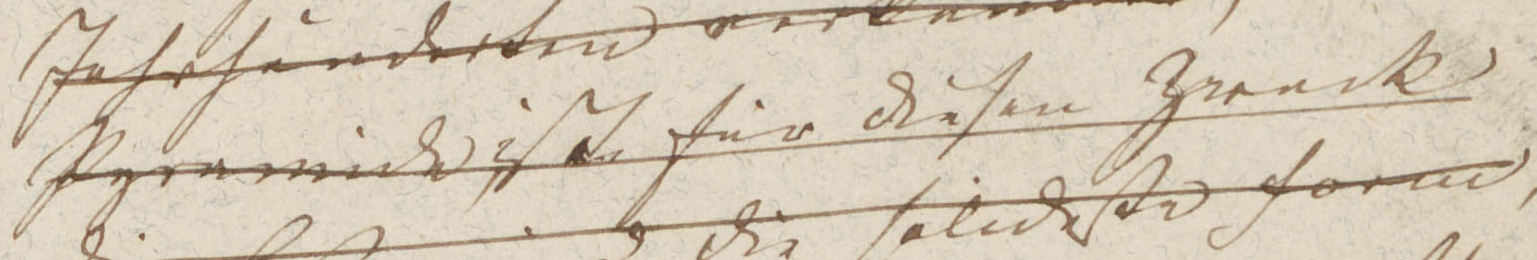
Pyramide ist für diesen Zweck
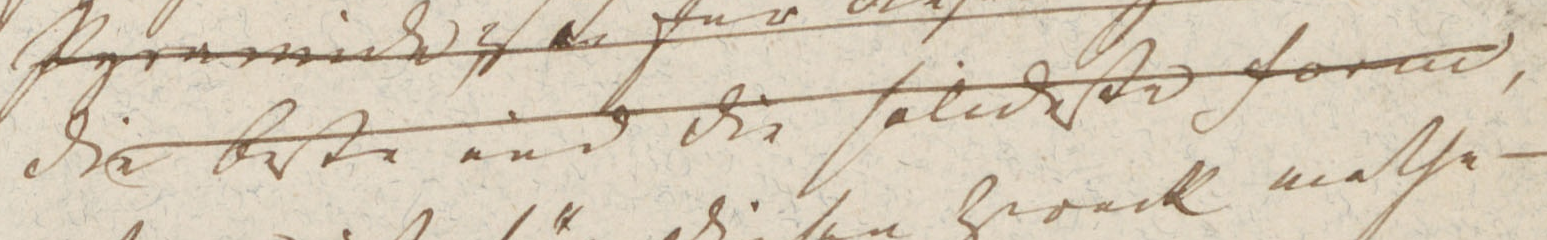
die beste und die solideste Form,
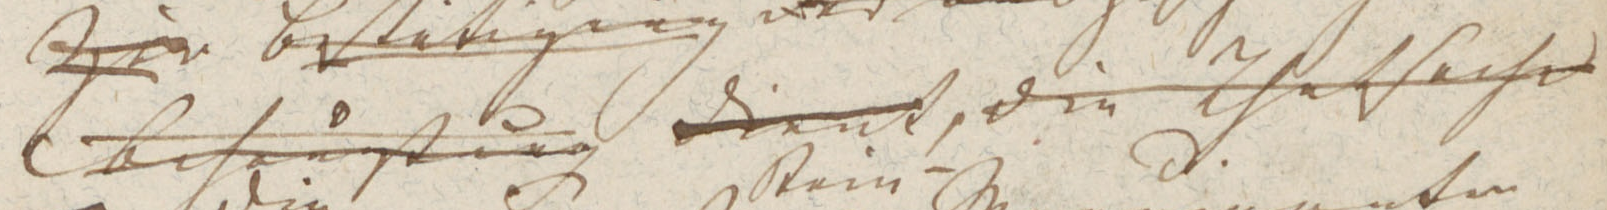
Behauptung dient, die Thatsache
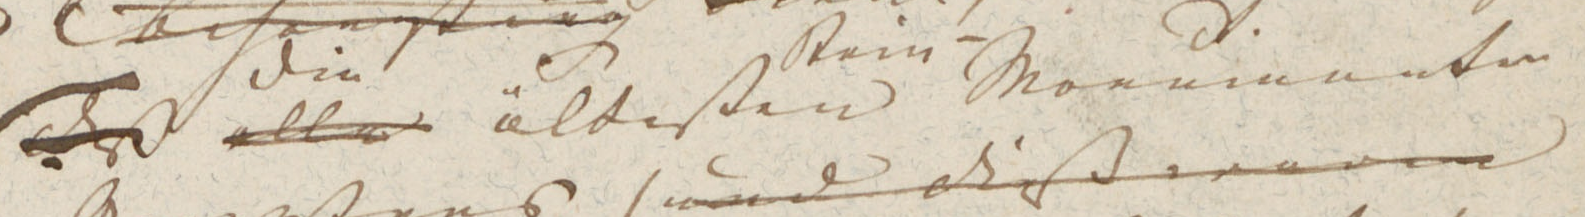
dass alle die ältesten Stein-Monumente
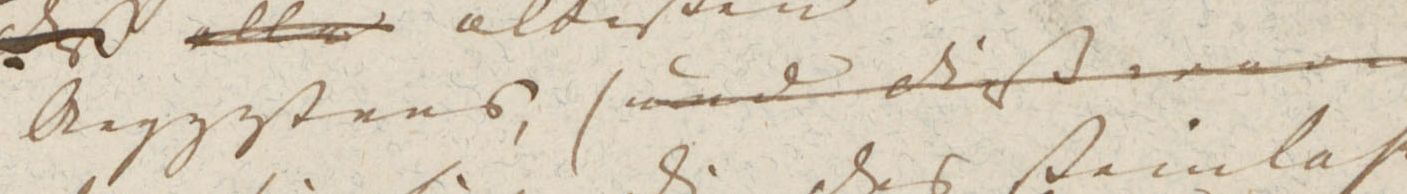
Aegyptens, (und diess waren
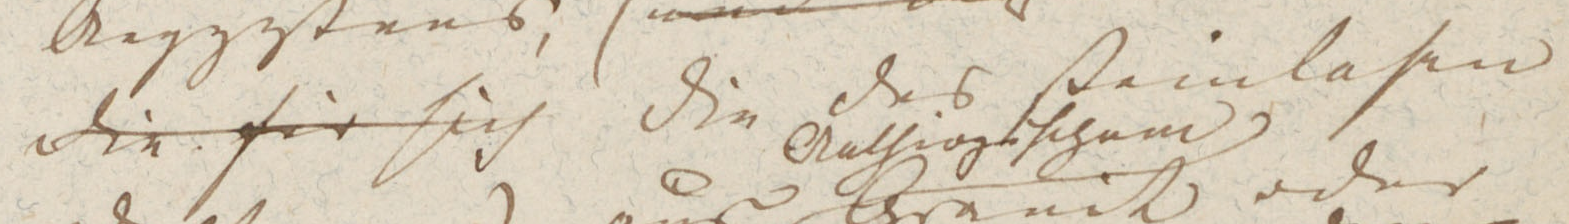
die für sich die des steinlosen
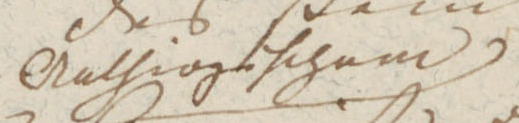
Aethiopischem
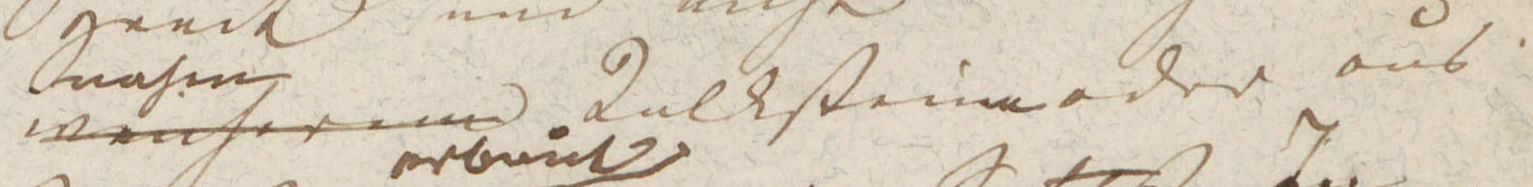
weicherem nahen Kalksteine oder aus
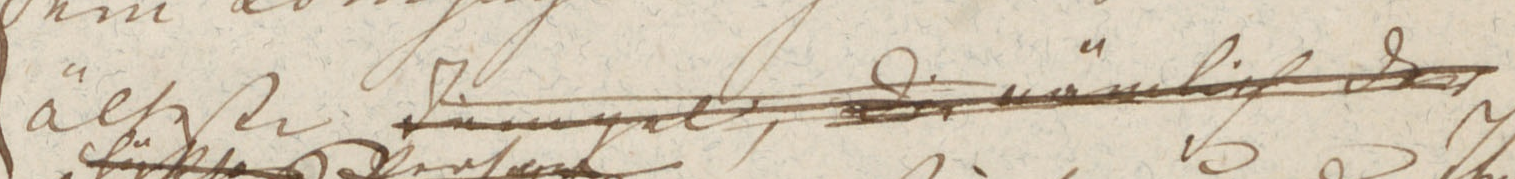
älteste Tempel, die nämlich der
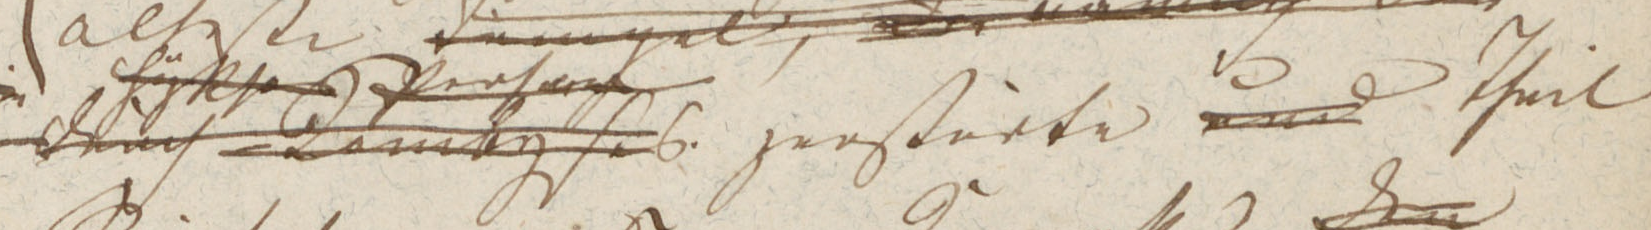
durch Kambyses höchsten Persern zerstörte und Theil
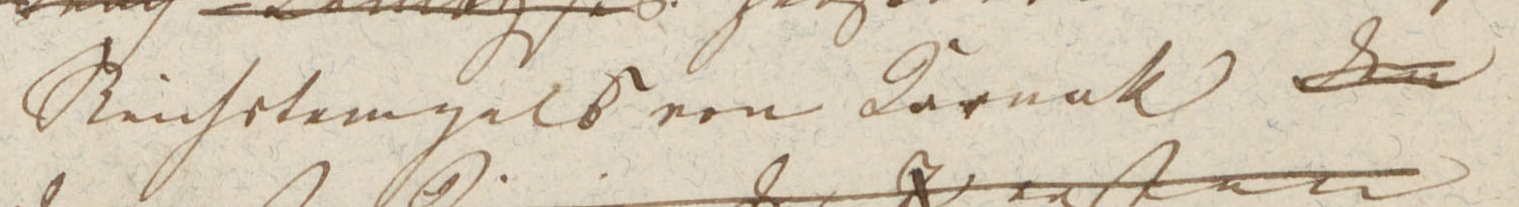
Reichstemptels von Karnak den
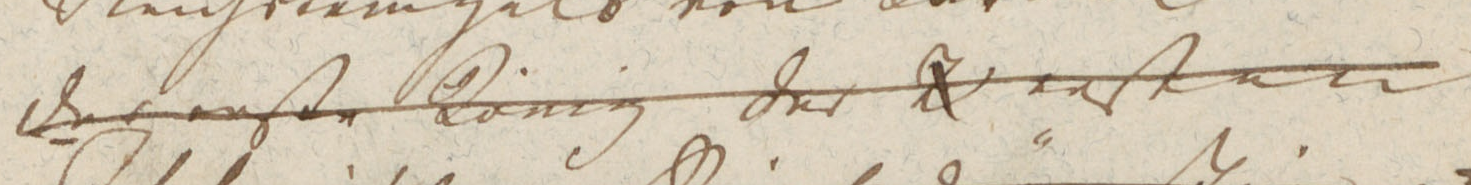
der erste König der T ersten
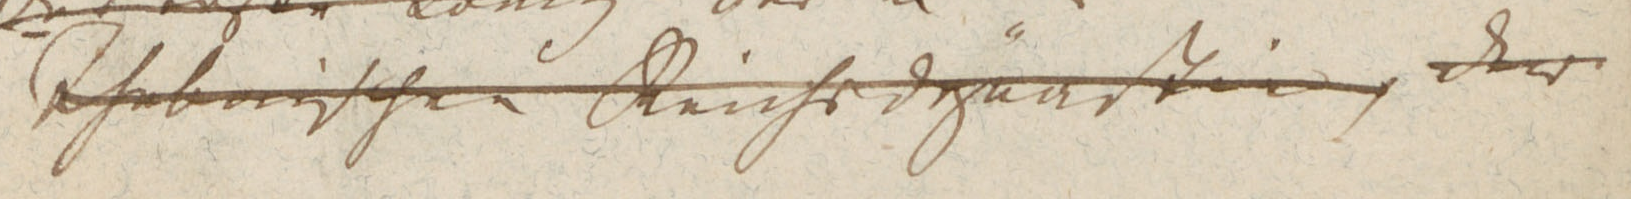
Thebaischen Reichsdynastie, der
